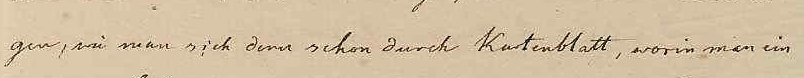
gen, wie man sich denn schon durch Kartenblatt, worin man ein
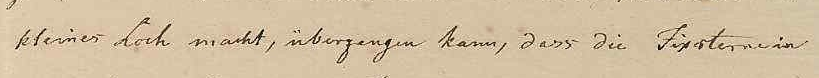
kleines Loch macht, überzeugen kann, dass die Fixsterne in
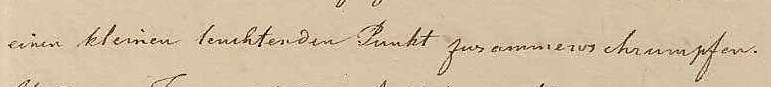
einen kleinen leuchtenden Punkt zusammenschrumpfen.
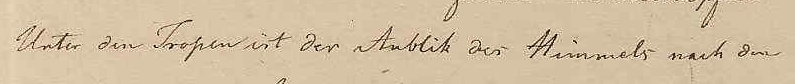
Unter den Tropen ist der Anblick des Himmels nach den
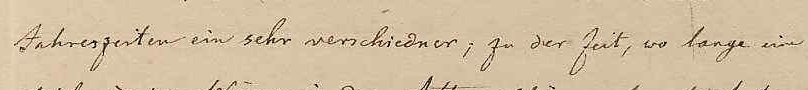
Jahreszeiten ein sehr verschiedner; zu der Zeit, wo lange eine
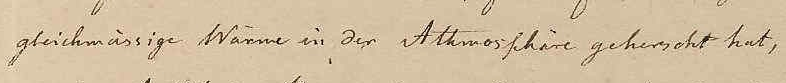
gleichmässige Wärme in der Athmosphäre geherscht hat,
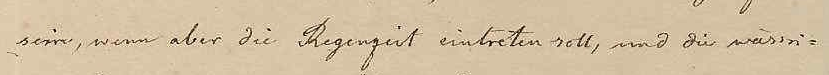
sein, wenn aber die Regenzeit eintreten soll, und die wässri-
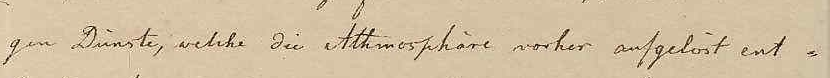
gen Dünste, welche die Athmosphäre vorher aufgelöst ent-
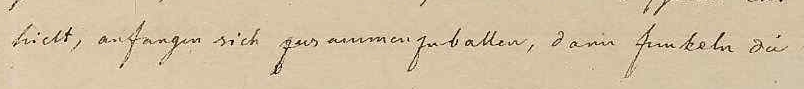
hielt, anfangen sich zusammenzuballen, dann funkeln die
